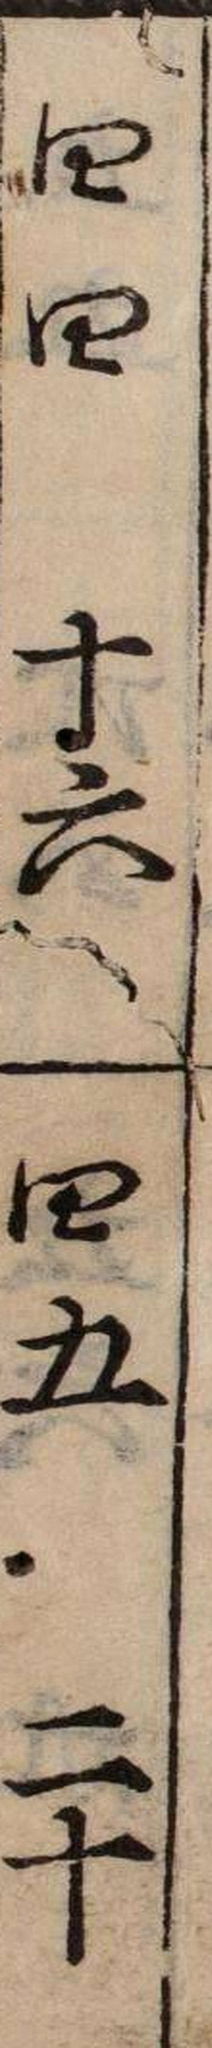四四十六四五二十

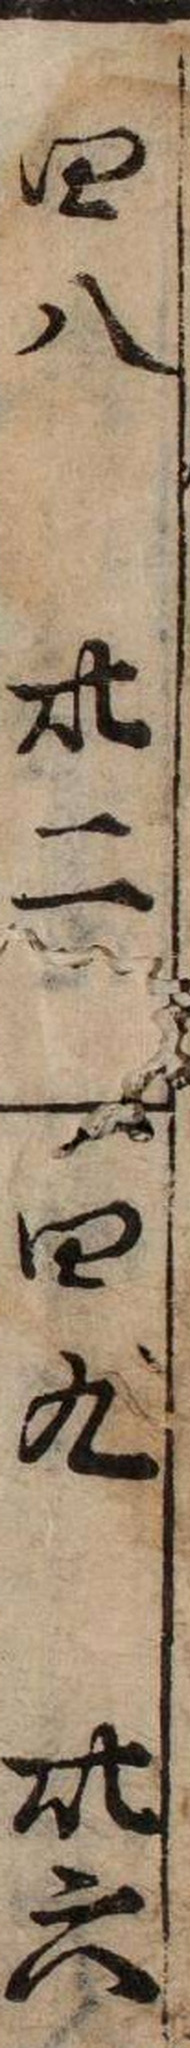四八卅二四九卅六
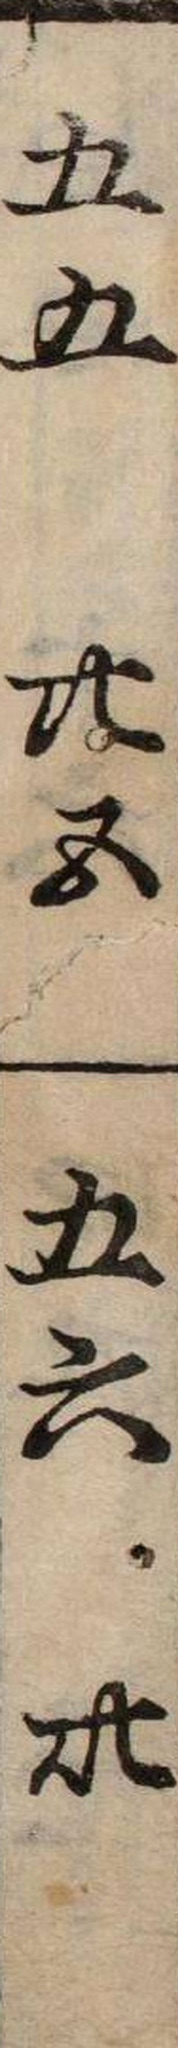五五廾五五六卅
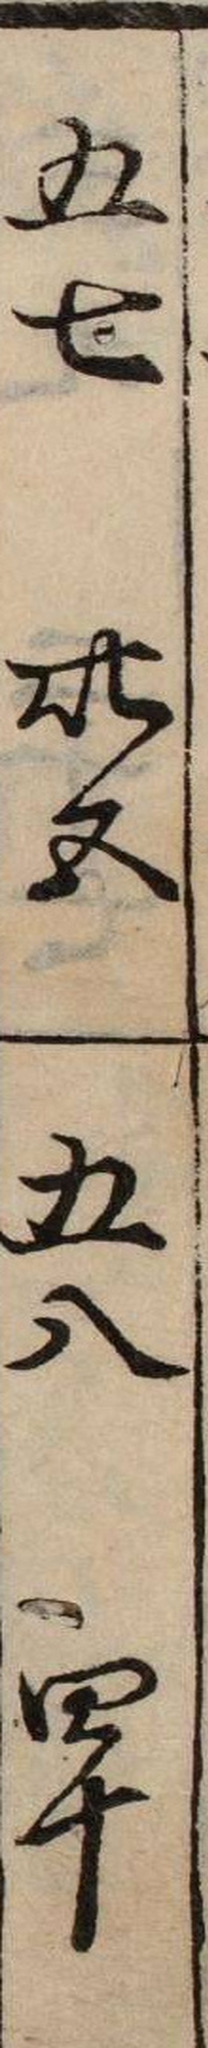五七卅五五八四十
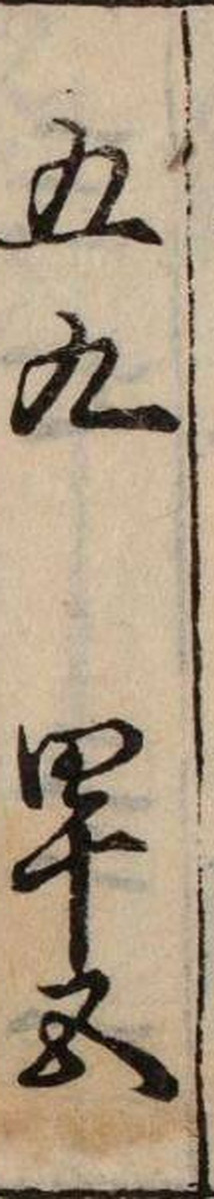五九四十五
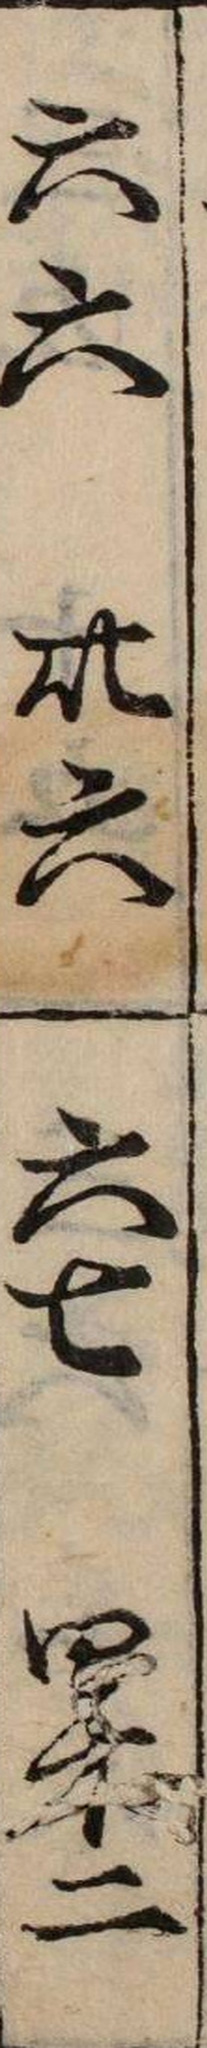六六卅六六七四十二
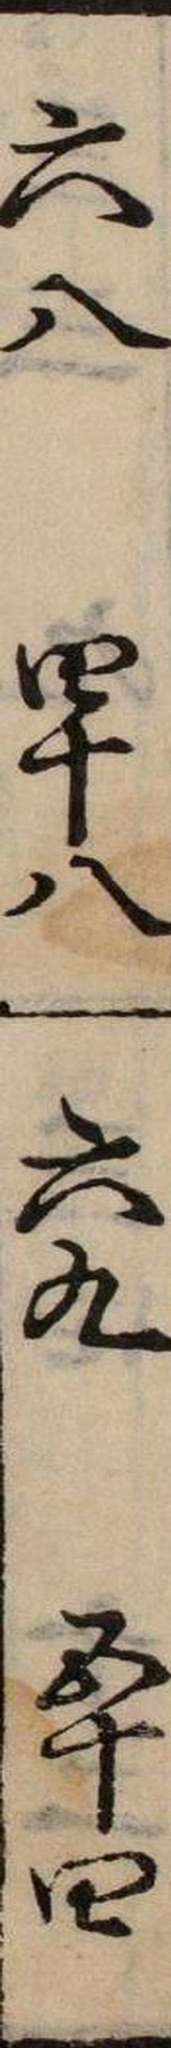六八四十八六九五十四
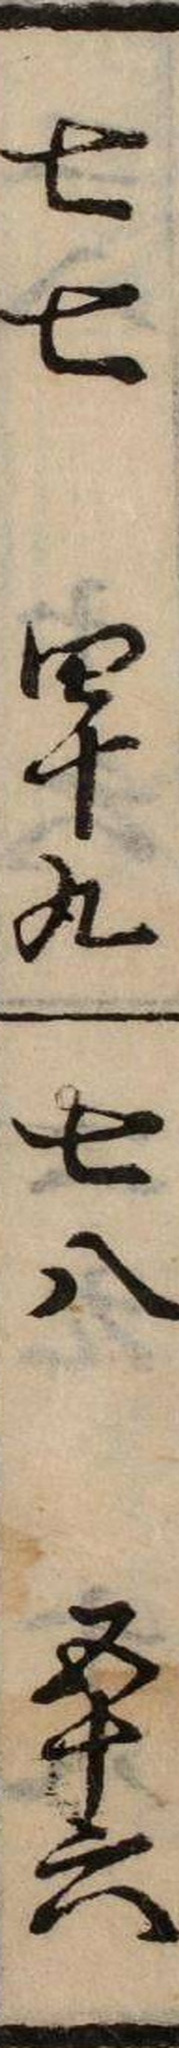七七四十九七八五十六
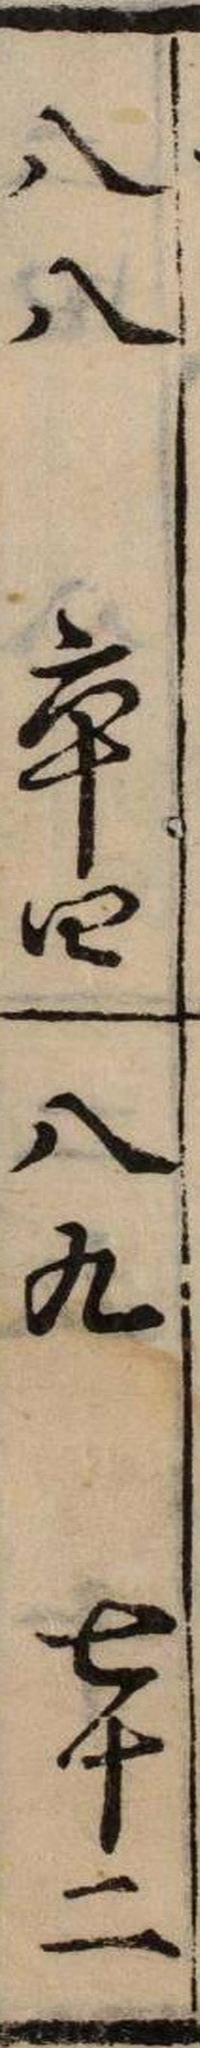八八六十四八九七十二
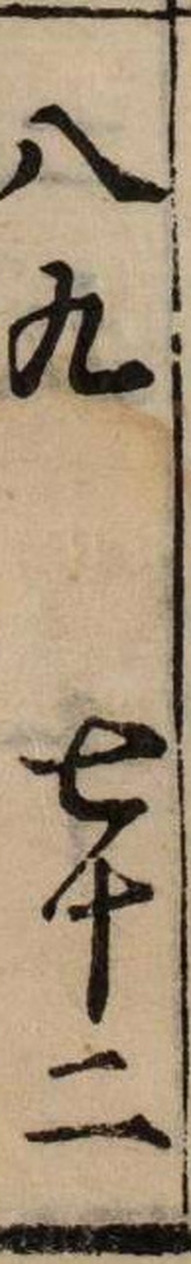九九八十二
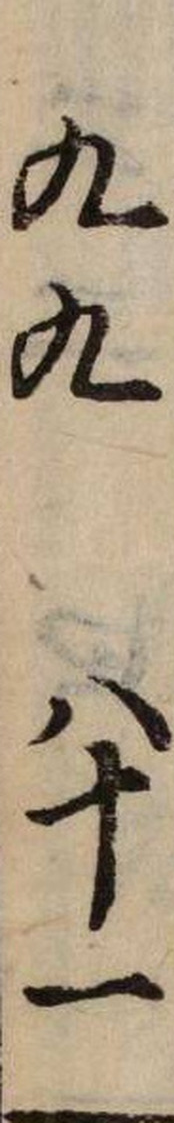九九八十二
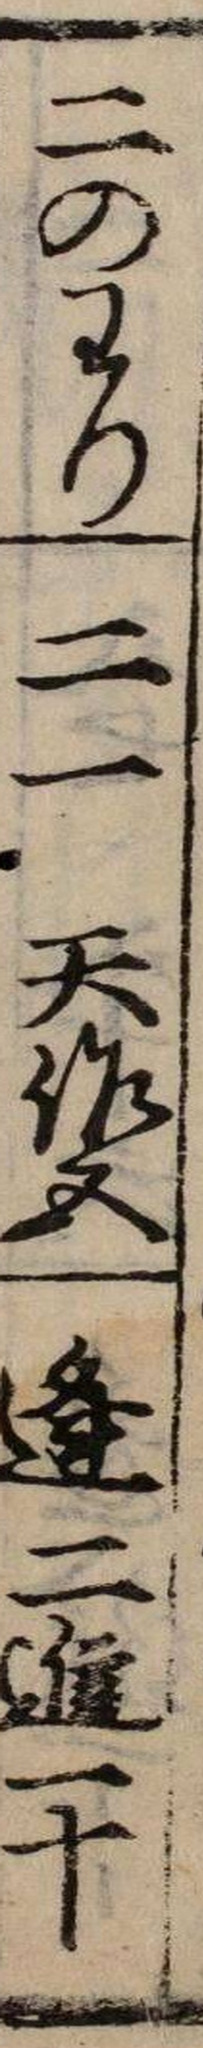二のわり二一天作五逢二進一十
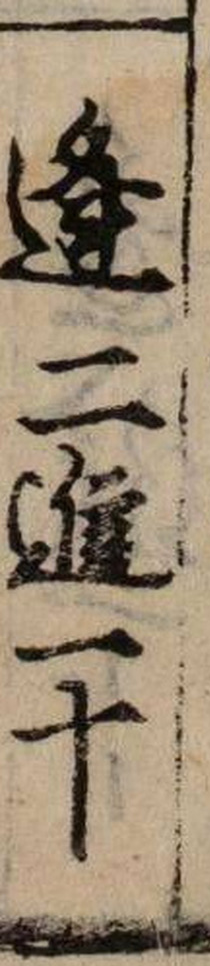逢三進一十
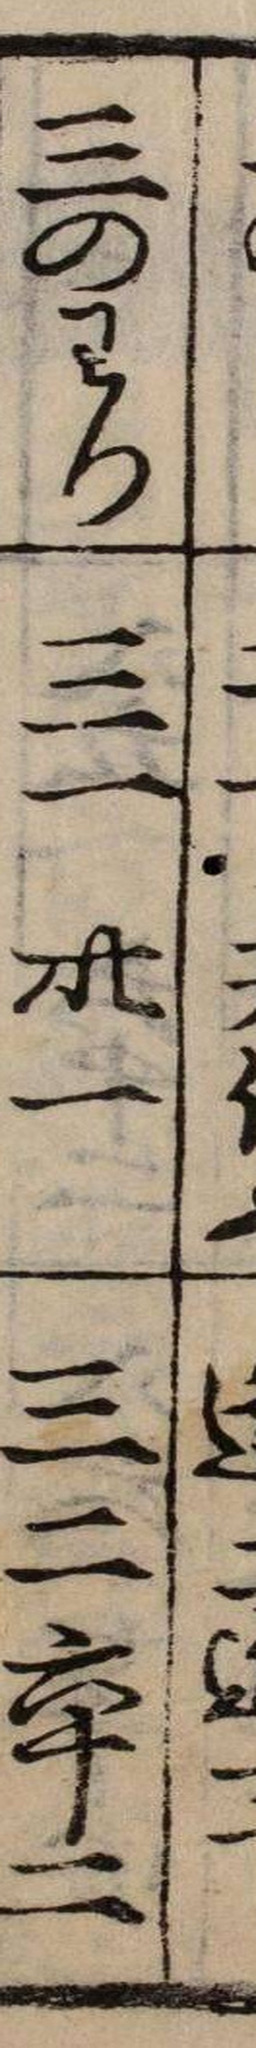三のわり三一卅一三二六十二
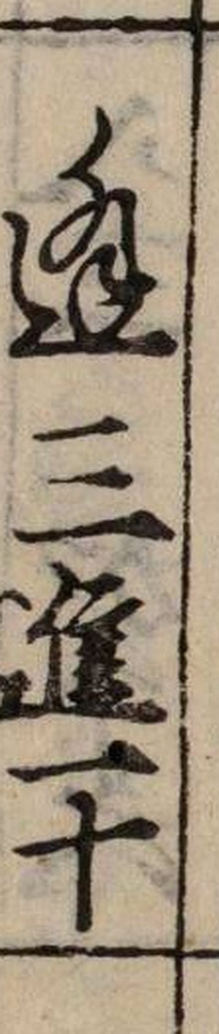逢三進一十
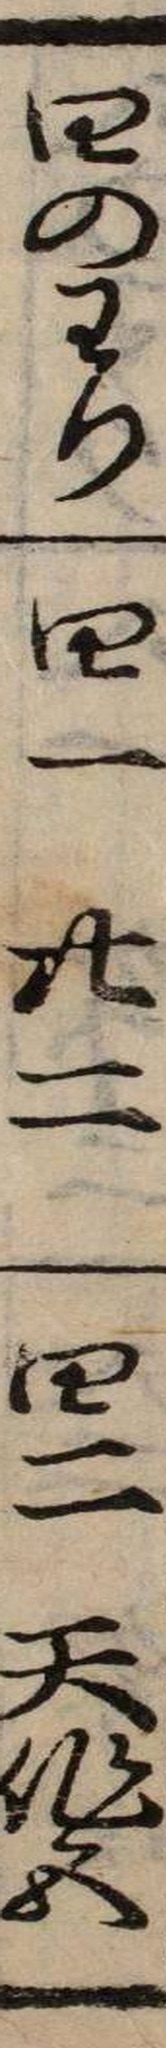四のわり四一廾二四二天作五
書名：塵劫記（寛永11年自跋、京都府立京都学・歴彩館追貴8）
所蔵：京都府立京都学・歴彩館 国文学研究資料館
